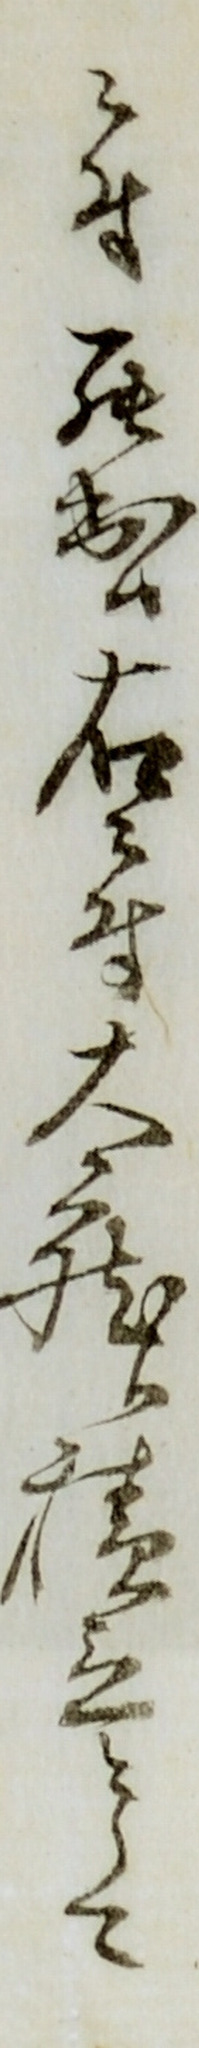に付罷出候右に付大蔵え積立として
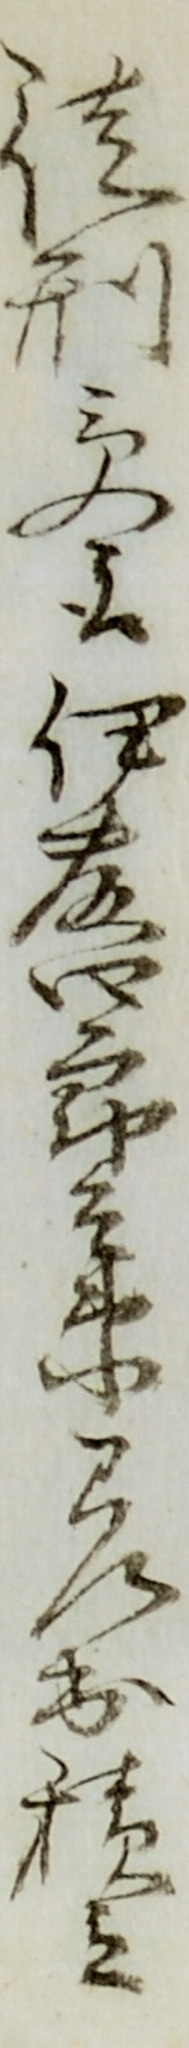徒刑受取伊藤四郎兵衛差出積立
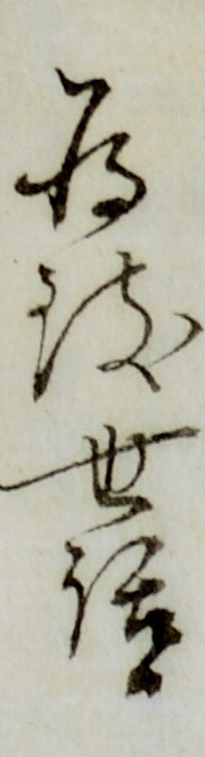為致世話候

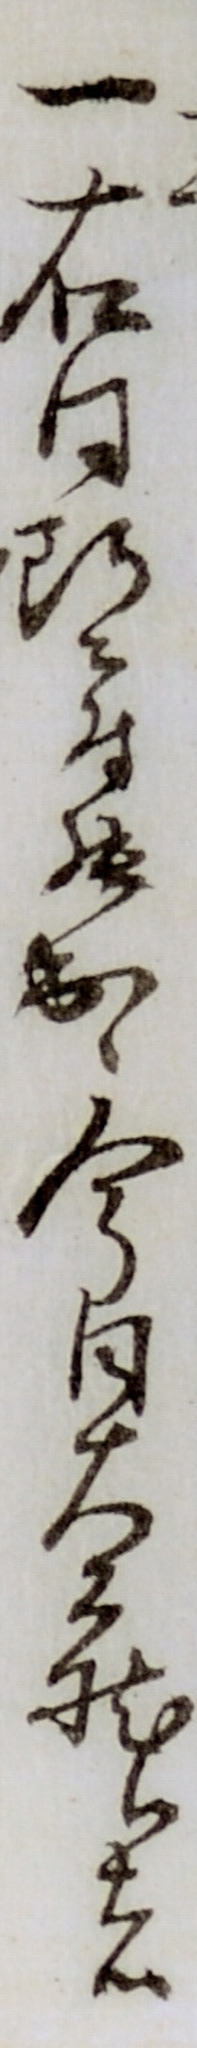一右同断に付罷出候今日大蔵えは
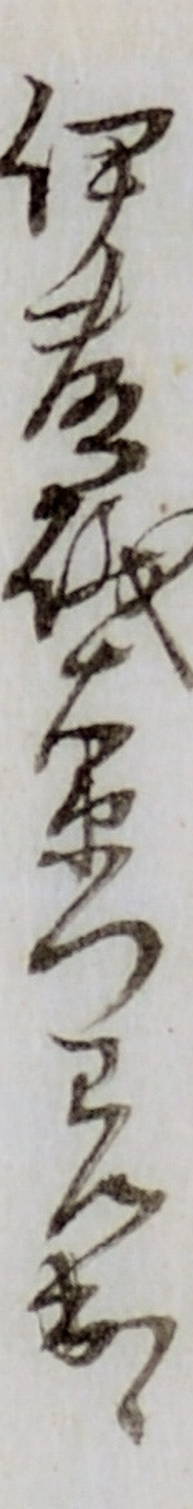伊東礒右衛門差出候
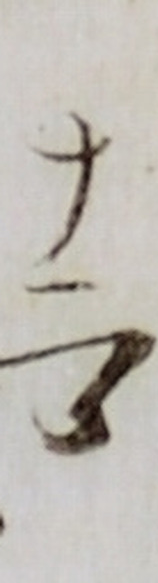十二日
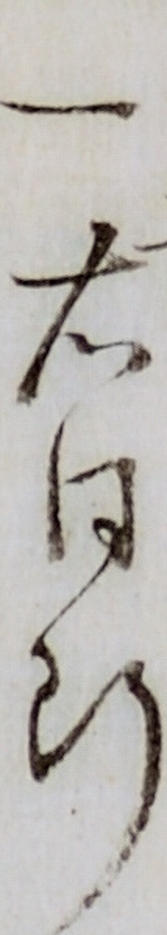一右同断
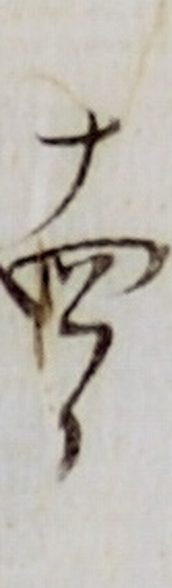十四日
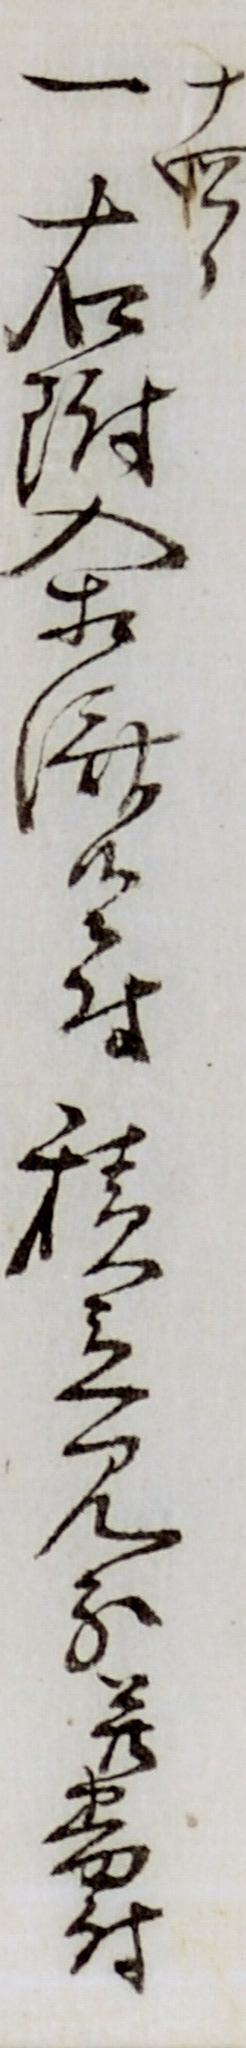一右附入相済候に付積立見分幷番付
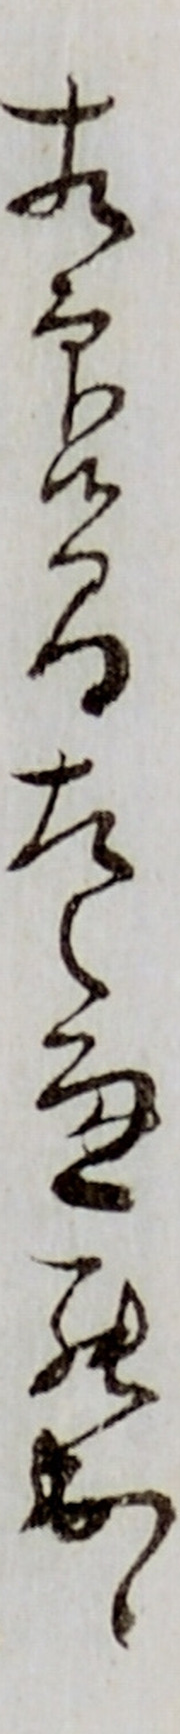相印候間左之通罷出候
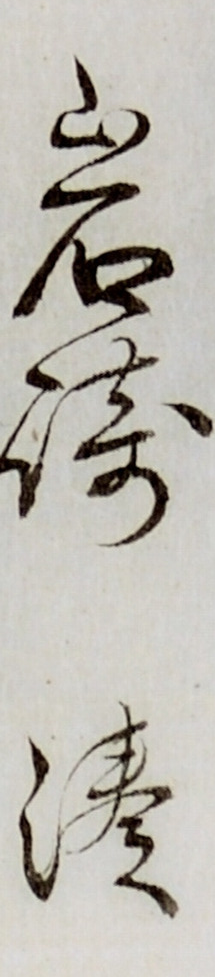岩崎湊
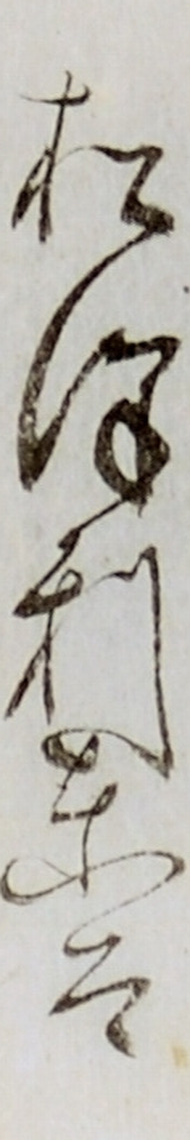松沢利東太
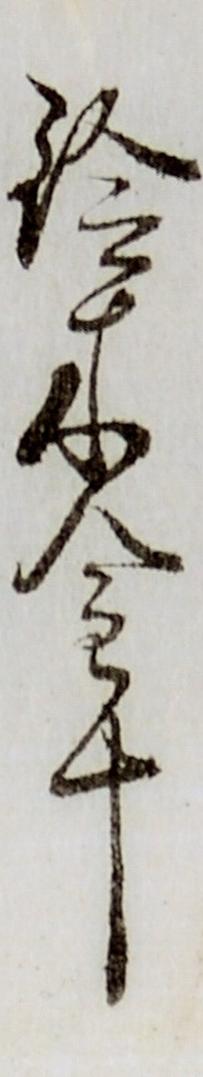鈴木金十
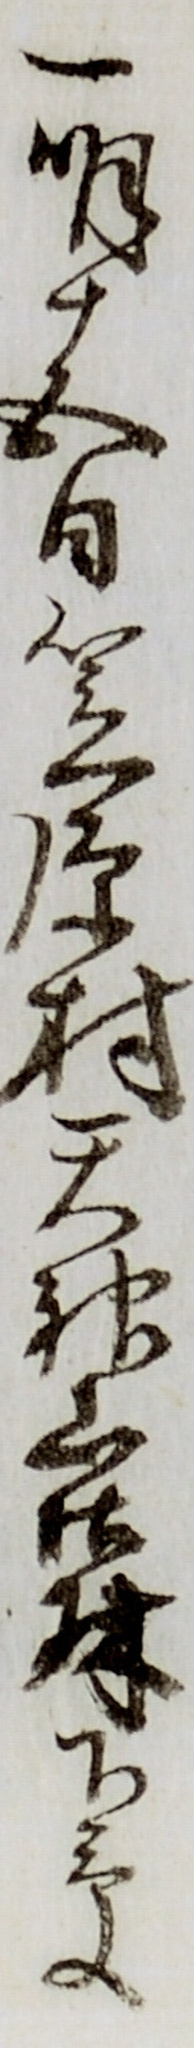一明十五日笠原村天神山御林下草
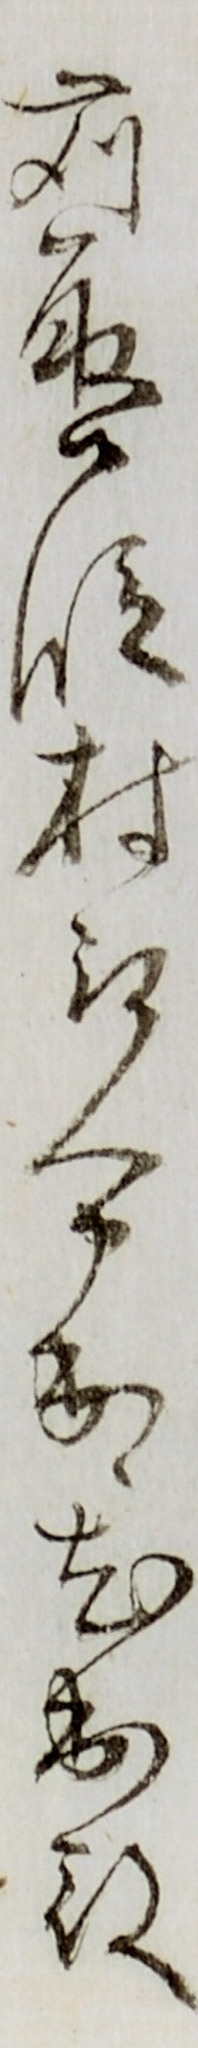苅取候段村人申出候尤出役
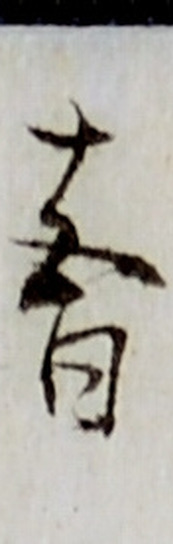十五日
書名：山林方諸事御用留
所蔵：伊那市立高遠町図書館・合同会社AMANE
